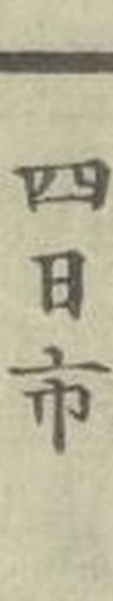四日市
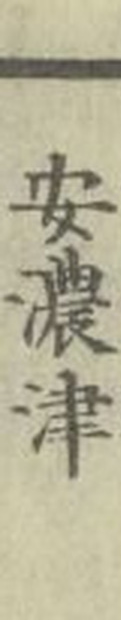安濃津

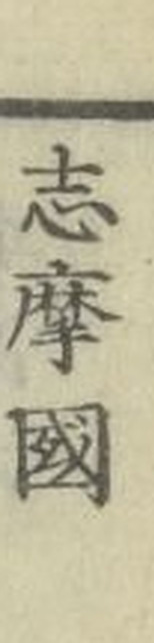志摩國
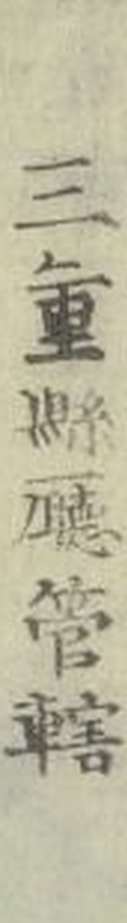三重縣廰管轄
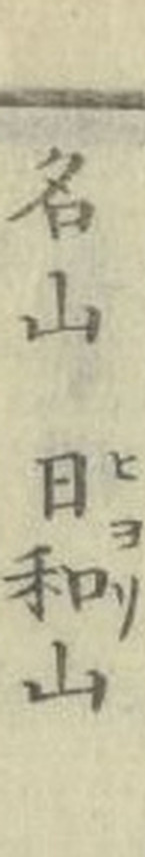名山日和山
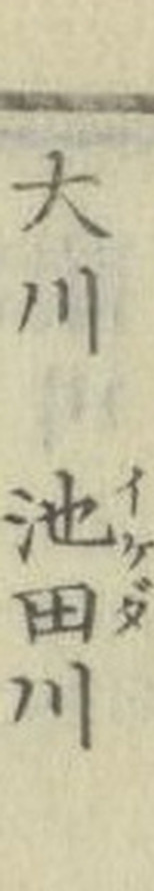大川池田川
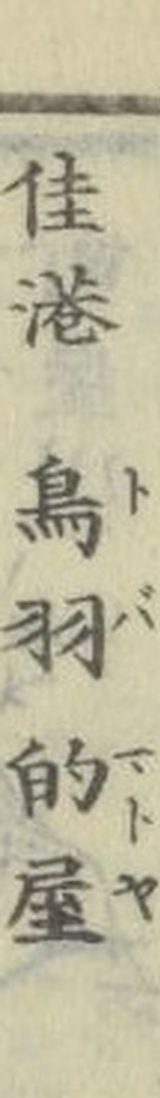佳港鳥羽的屋
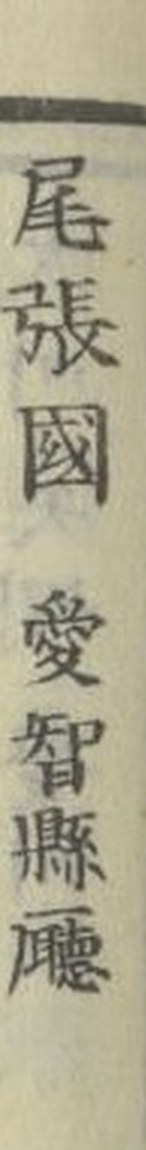尾張國愛智縣廰
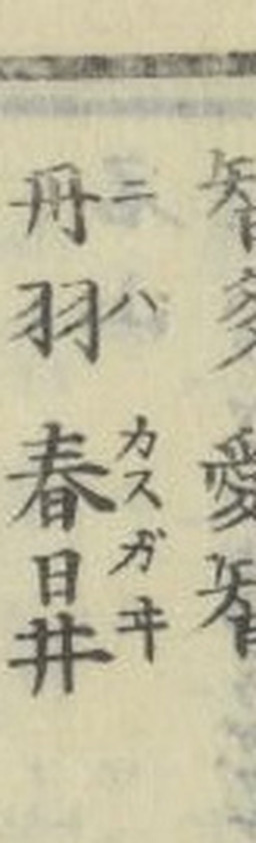丹羽春日井
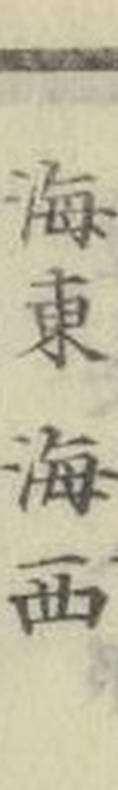海東海西
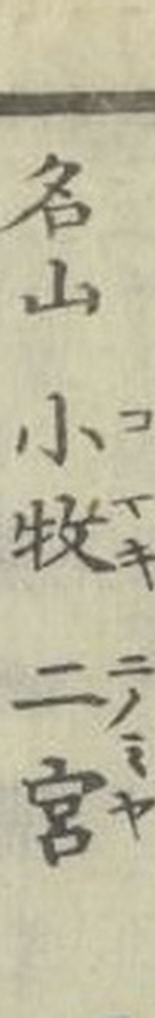名山小牧二宮
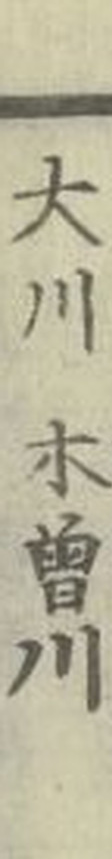大川木曽川

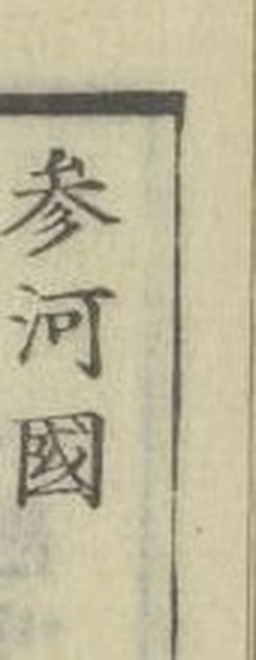参河國
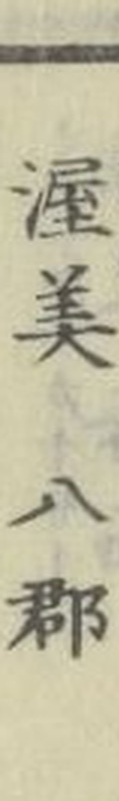渥美八郡
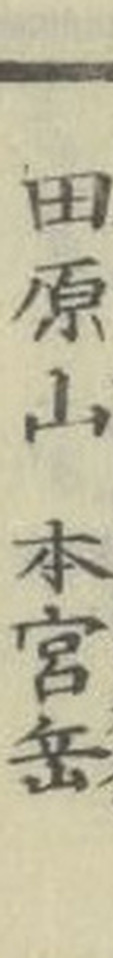田原山本宮岳
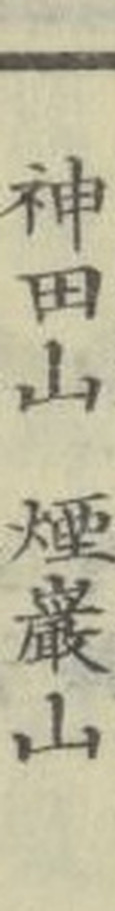神田山煙巌山
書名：下等小学日本地誌略図問答 巻上 畿内東海道之部
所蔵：University of the Ryukyus Library
